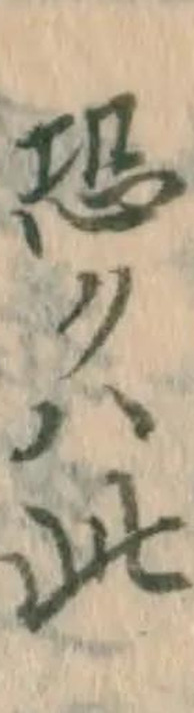恐クハ此
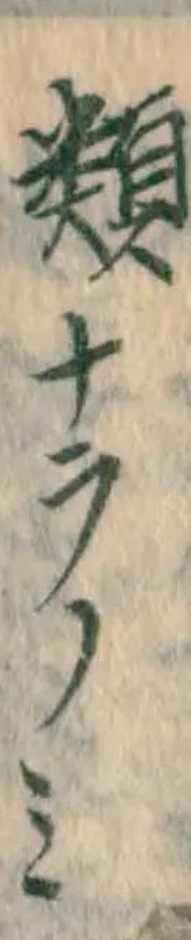類ナラノミ

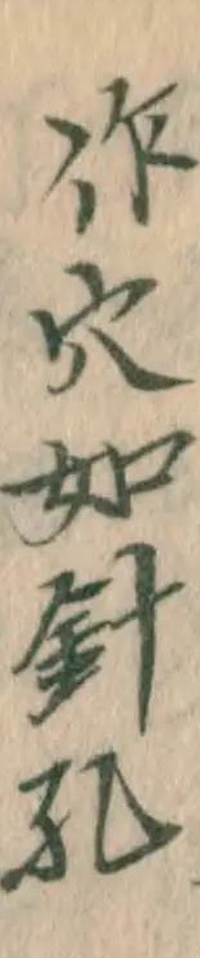作穴如針孔
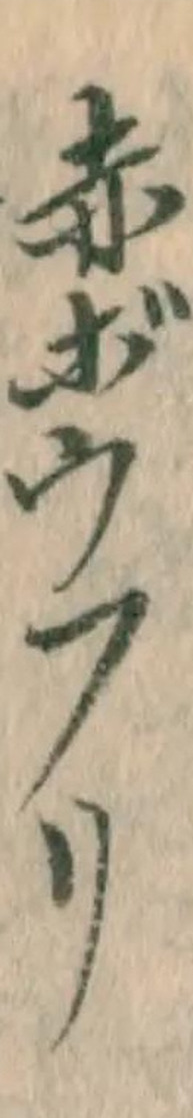赤ボウフリ
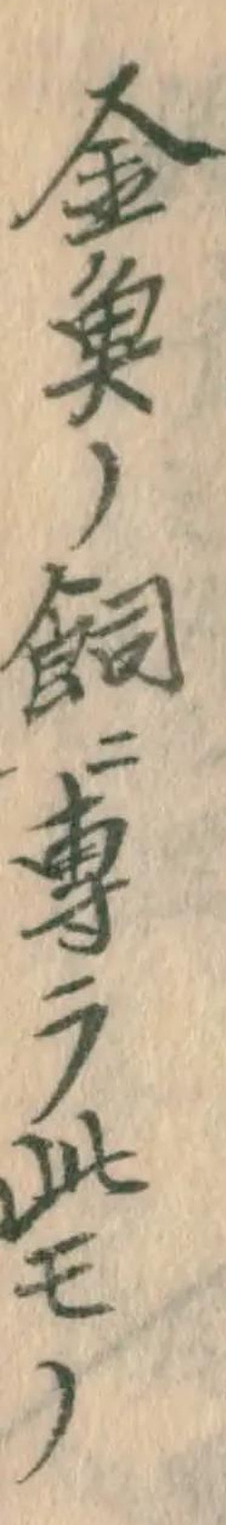金魚ノ飼ニ専ラ此モノ
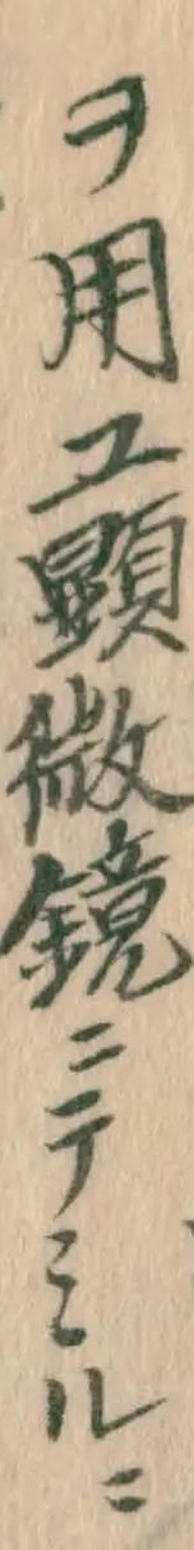ヲ用ユ顕微鏡ニテミルニ
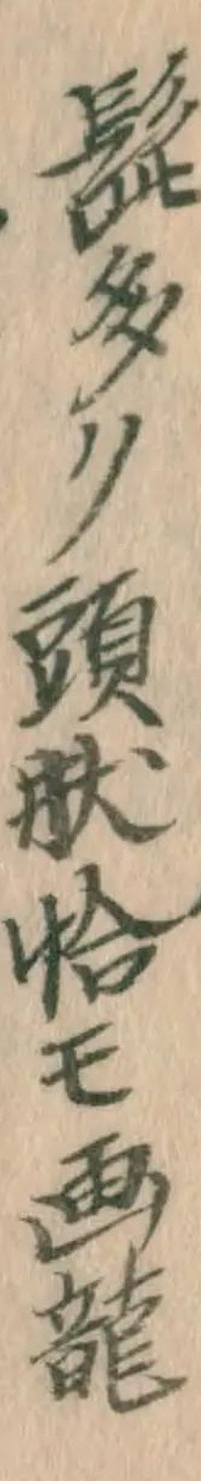髭多ク頭状恰モ画龍
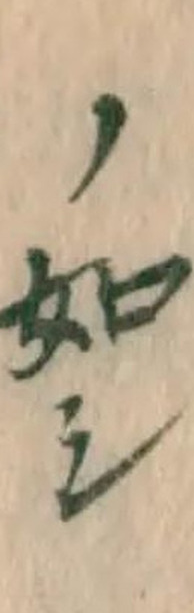ノ如シ
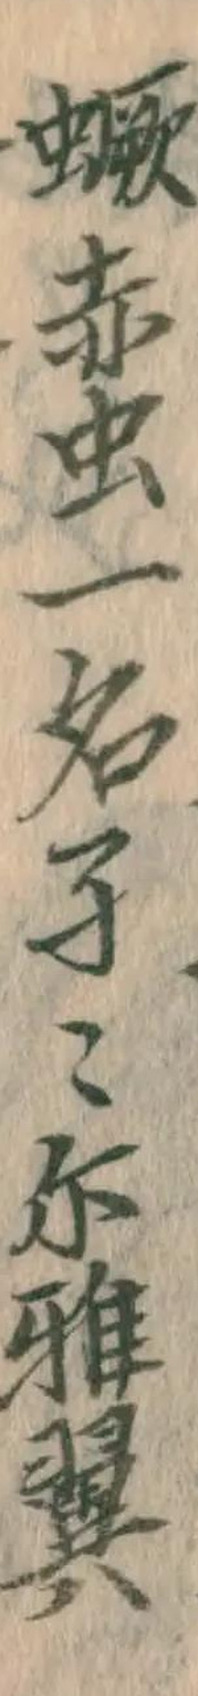蟩赤虫一名孑々尓雅翼
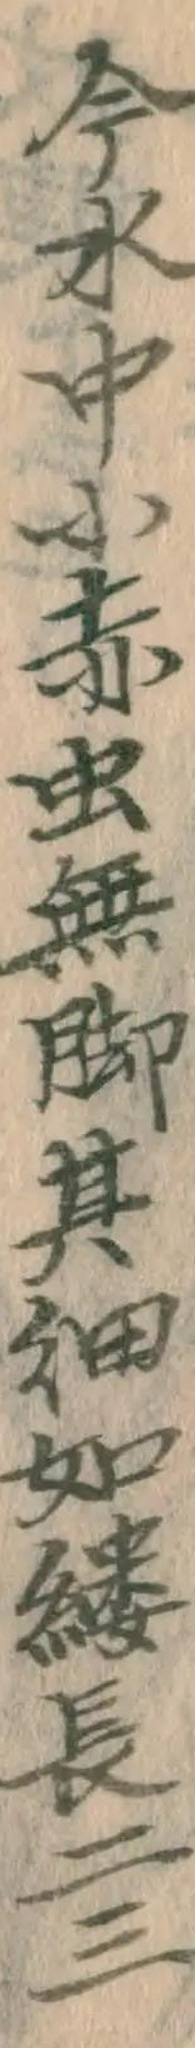今水中小赤虫無脚其細如縷長二三
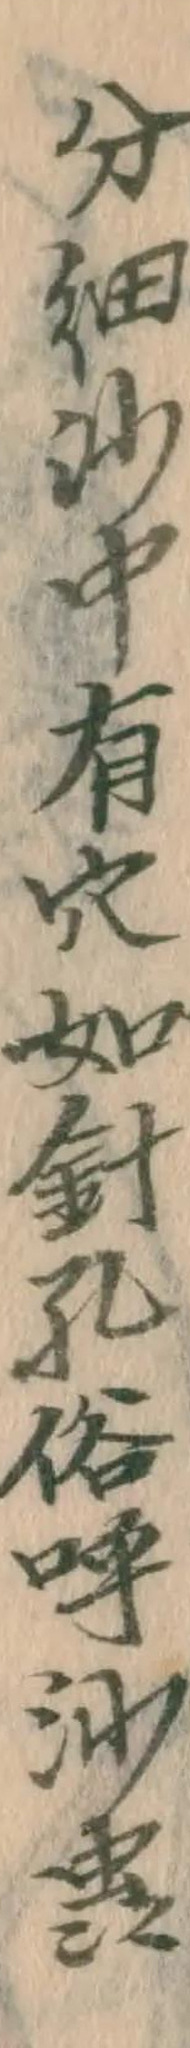分細沙中有穴如針孔俗呼沙蟲
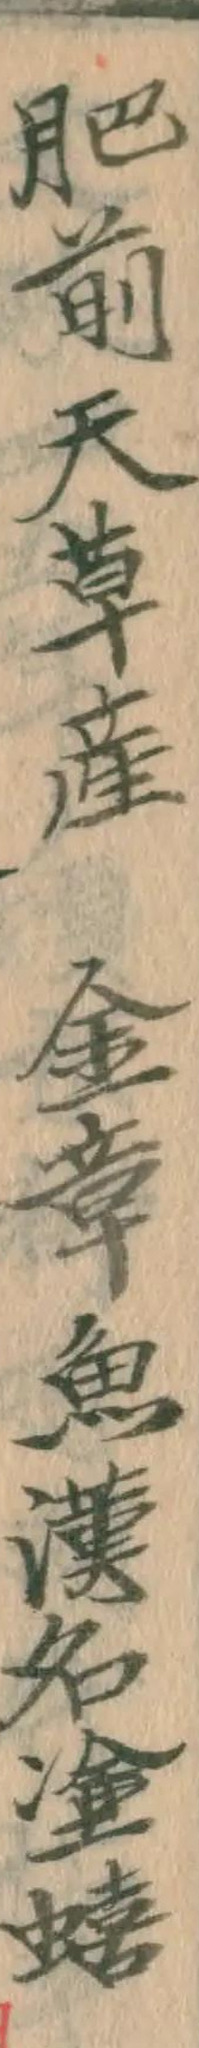肥前天草産金章魚官漢名塗蟢
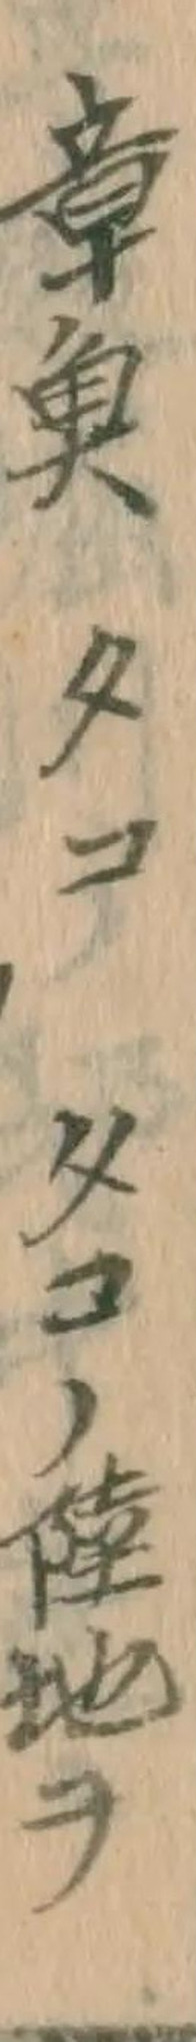章魚タコタコノ陸地ヲ
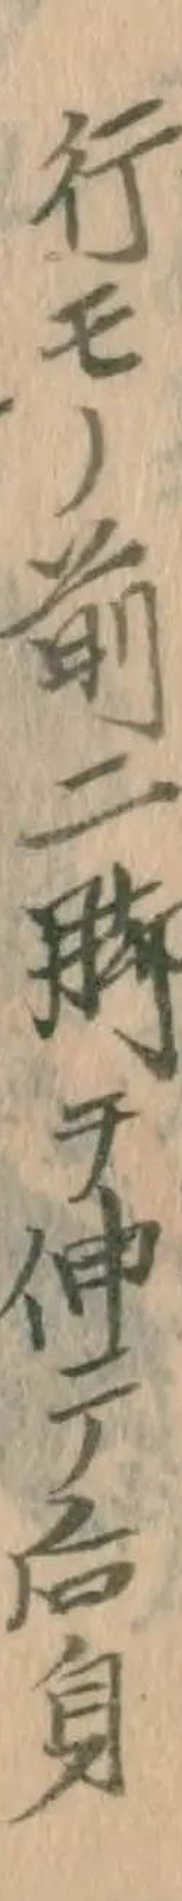行モノ前二脚ヲ伸テ后身
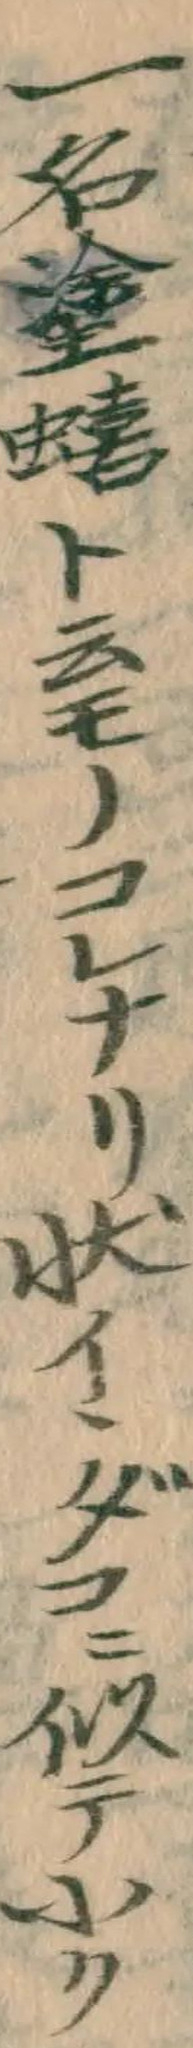一名塗蟢ト云モノコレナリ状イヽダコニ似テ小ク
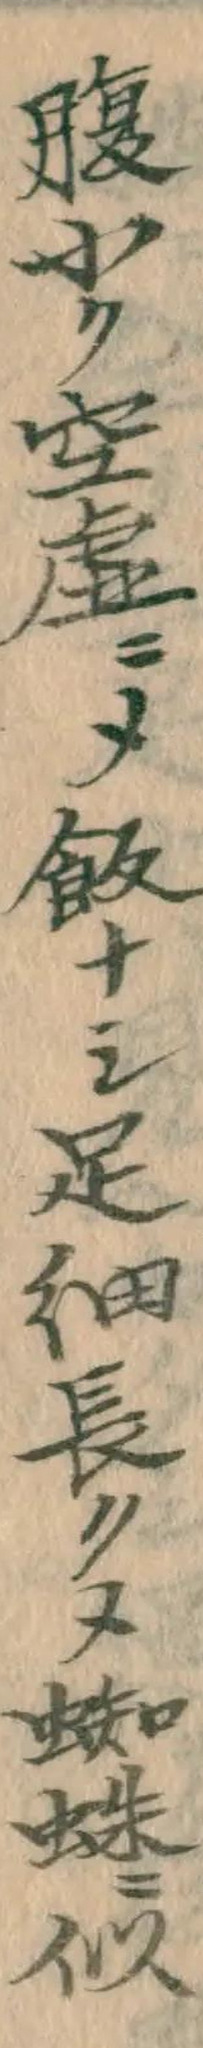腹小ク空虚ニシテ飯ナシ足細長クシテ蜘蛛ニ似
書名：千蟲譜 3巻. [2]
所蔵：国立国会図書館 National Diet Library, JAPAN
